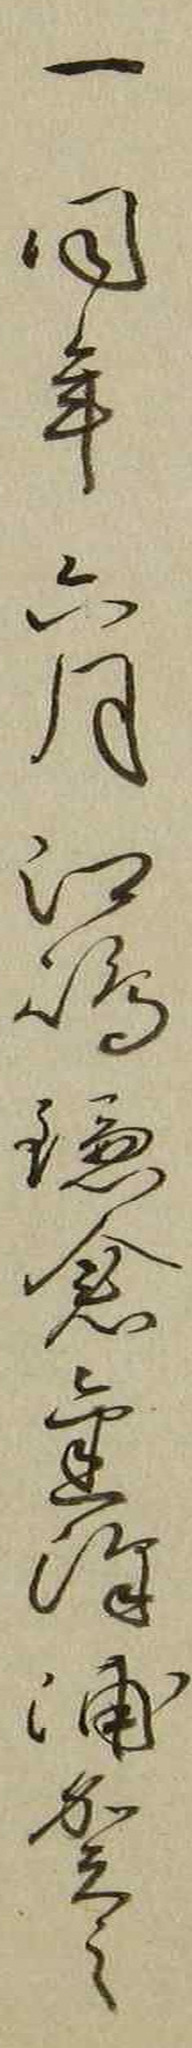一同年六月江嶋鎌倉金澤浦賀之
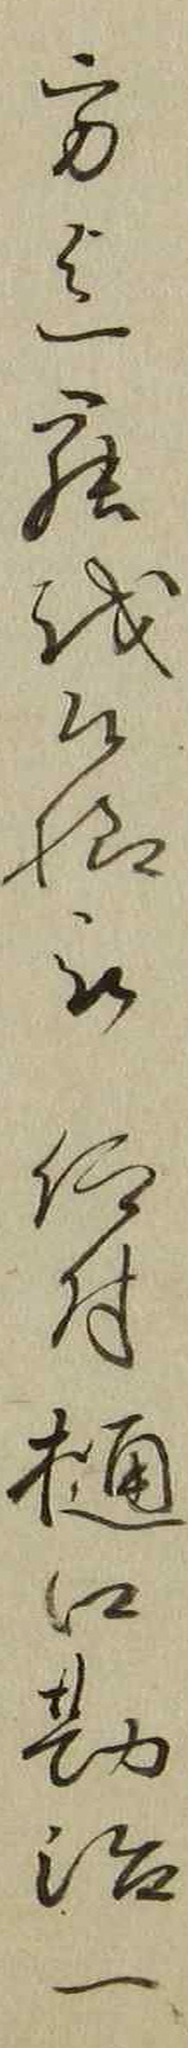方迄罷越候様被仰付樋口勘治一
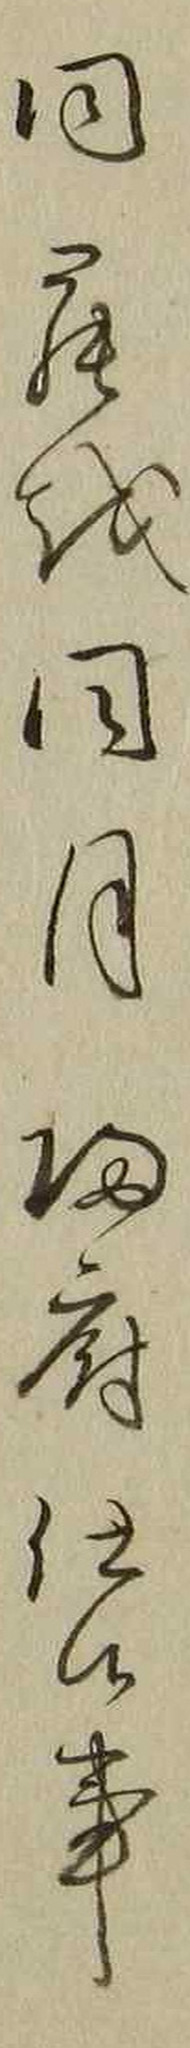同罷越同月帰府仕候事
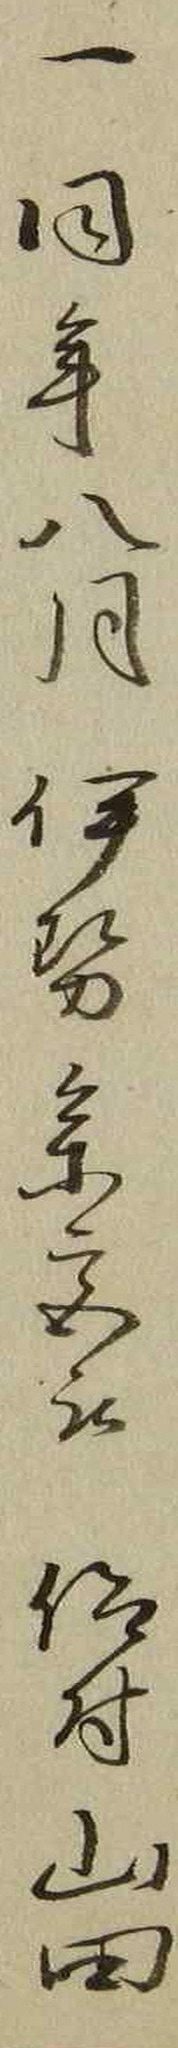一同年八月伊勢参宮被仰付山田
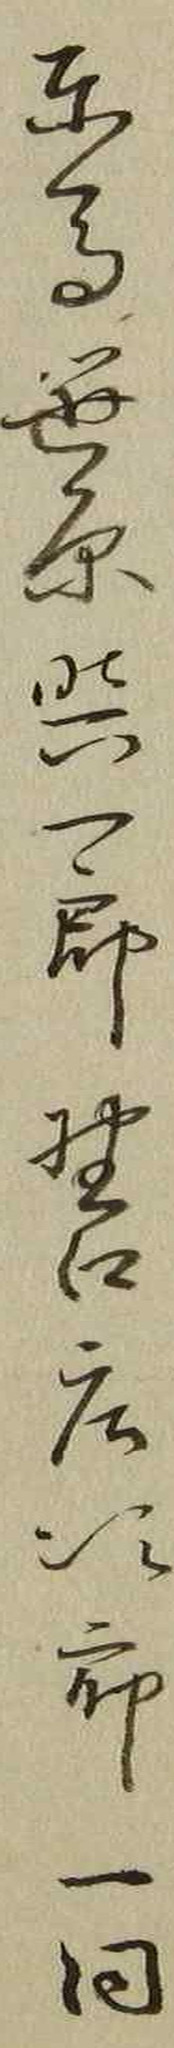東馬笹原與一郎野口庄次郎一同
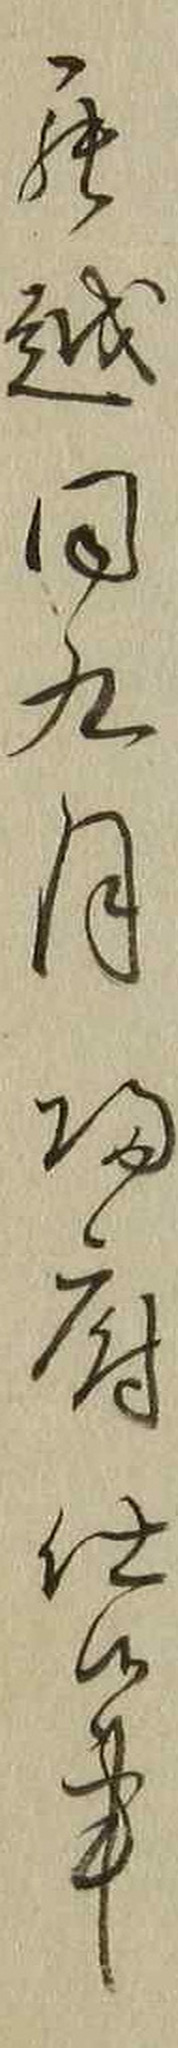罷越同九月帰府仕候事
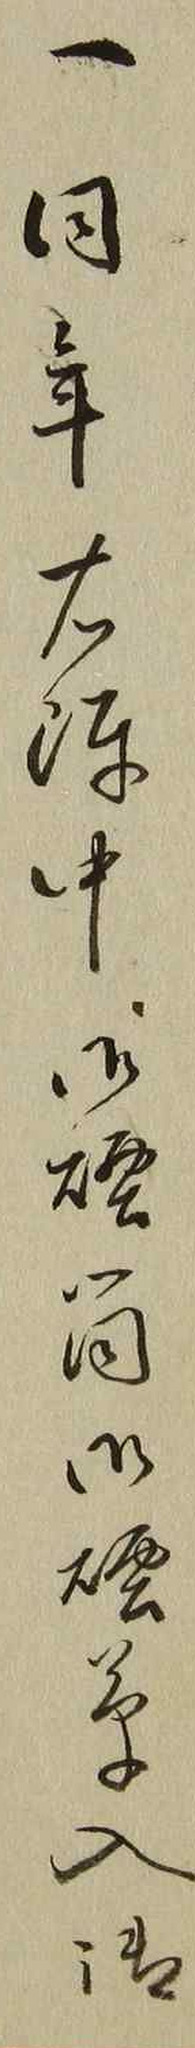一同年右陣中御煙筒御煙草入御
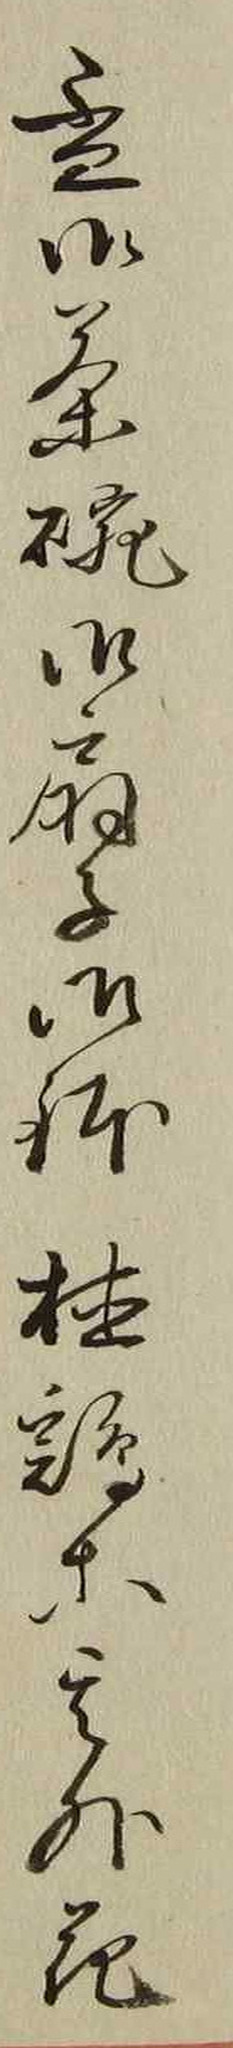盃御茶碗御扇子御鉢植等其外花
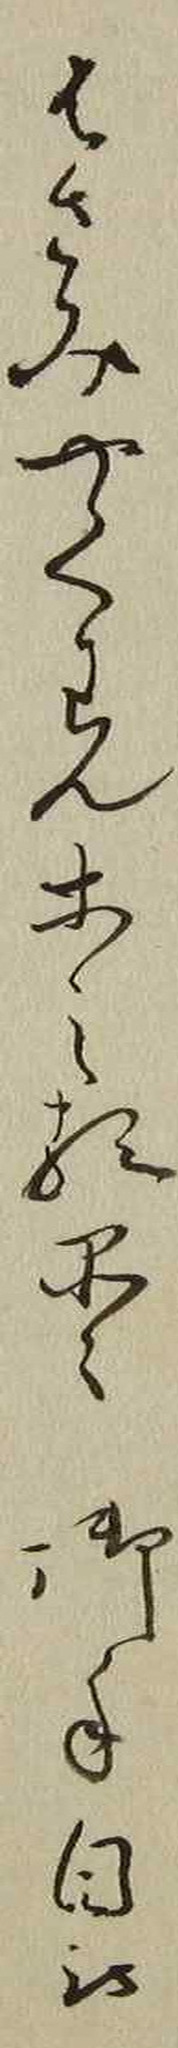はさみやくわん等の類品々御手自被
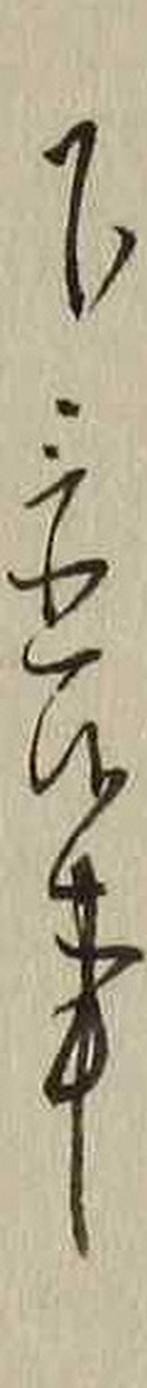下置候事
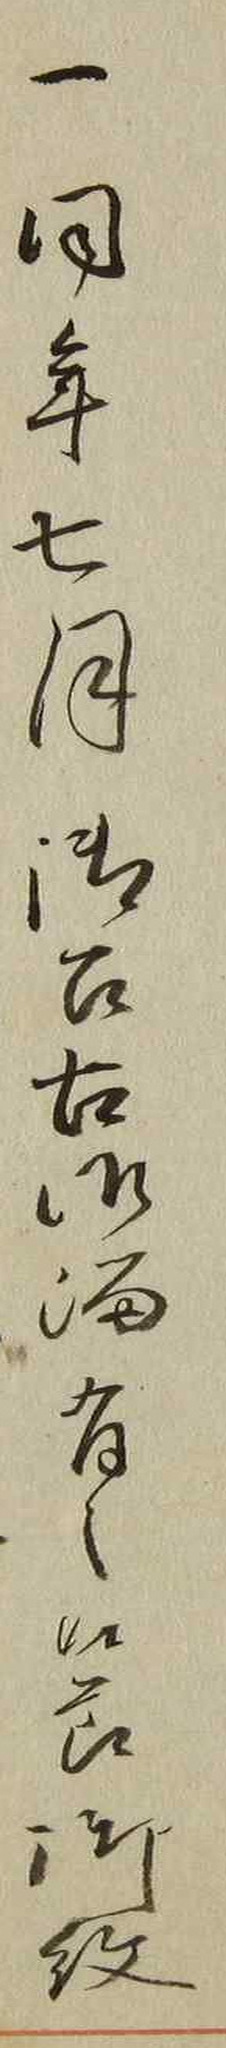一同年七月御召古御溜有之候節御紋
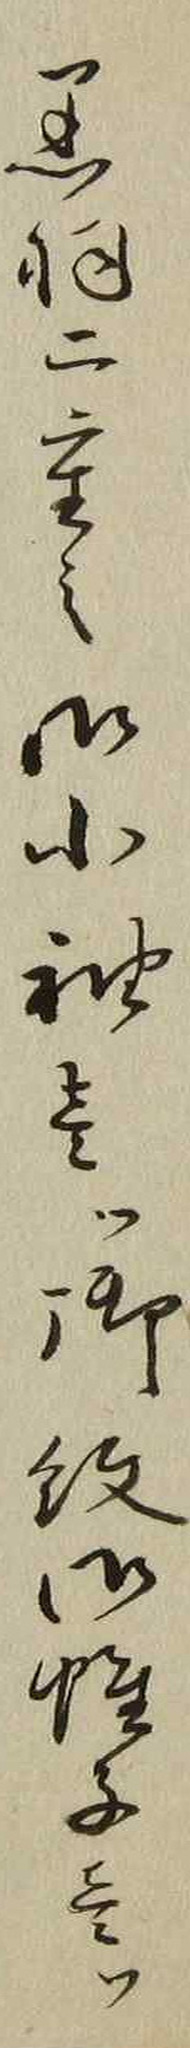黒羽二重之御小袖壱ツ御紋御帷子壱ツ
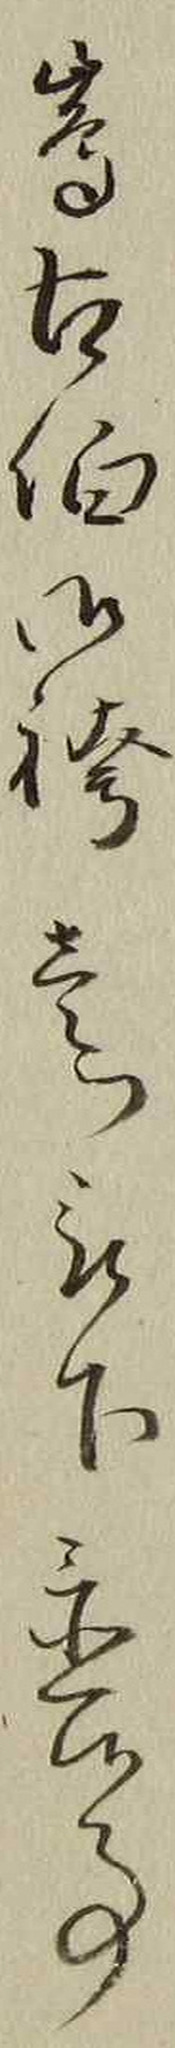嶌古伯御袴一ツ被下置候事
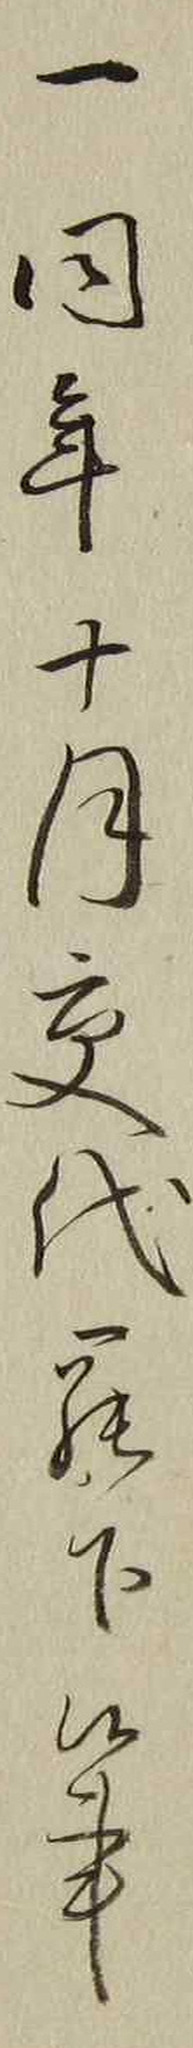一同年十月交代罷下候事
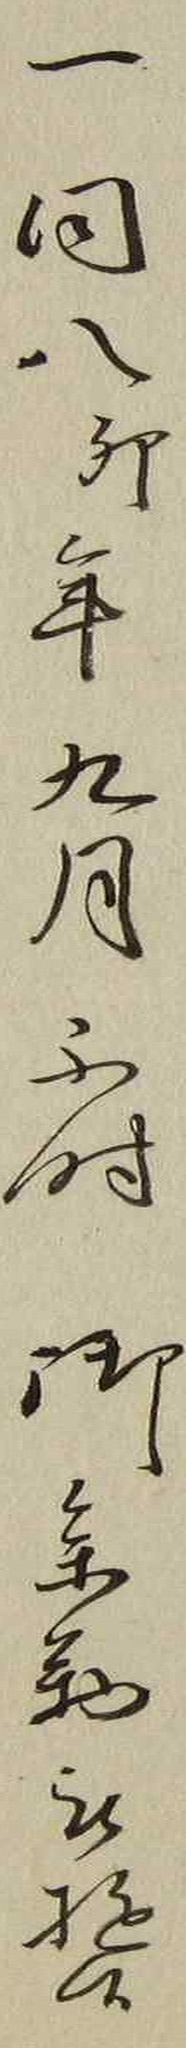一同八卯年九月不時御参勤被遊候
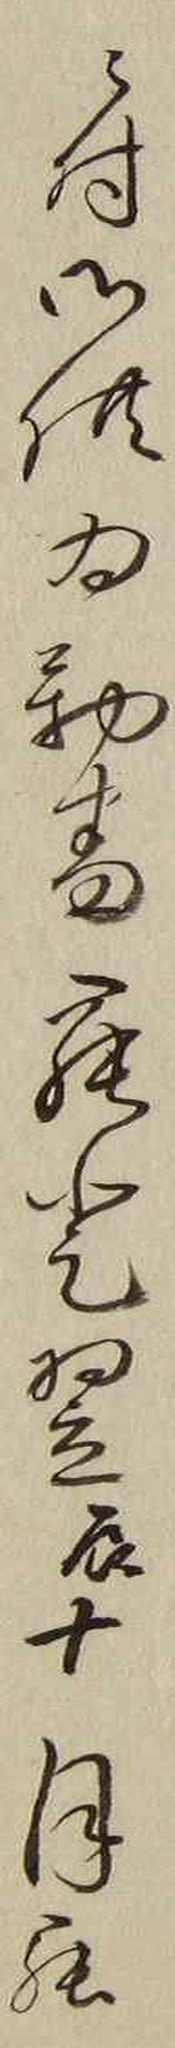ニ付御供為勤番罷登翌辰十月罷
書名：諸士系譜　巻之3　い之部3
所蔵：会津若松市立会津図書館
